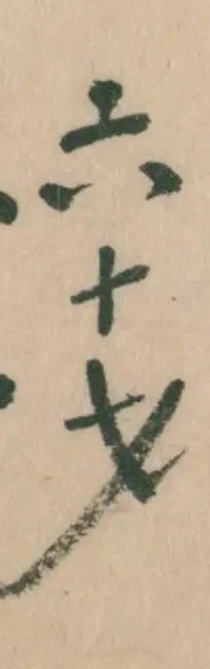六十才

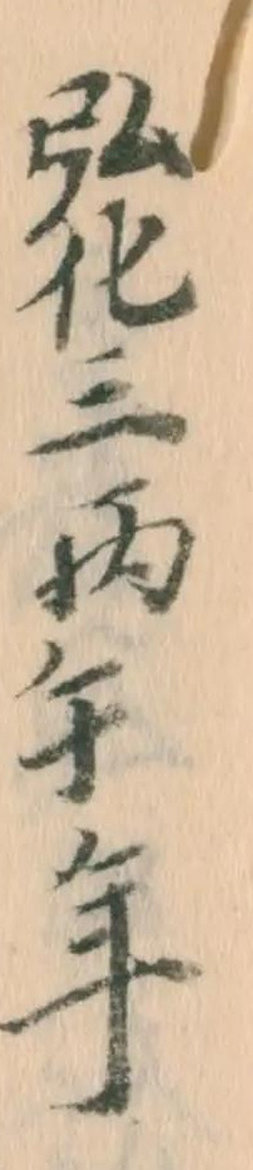弘化三丙午年
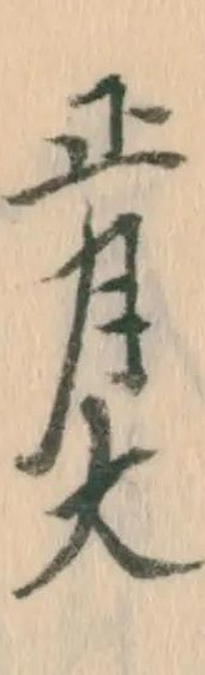正月大
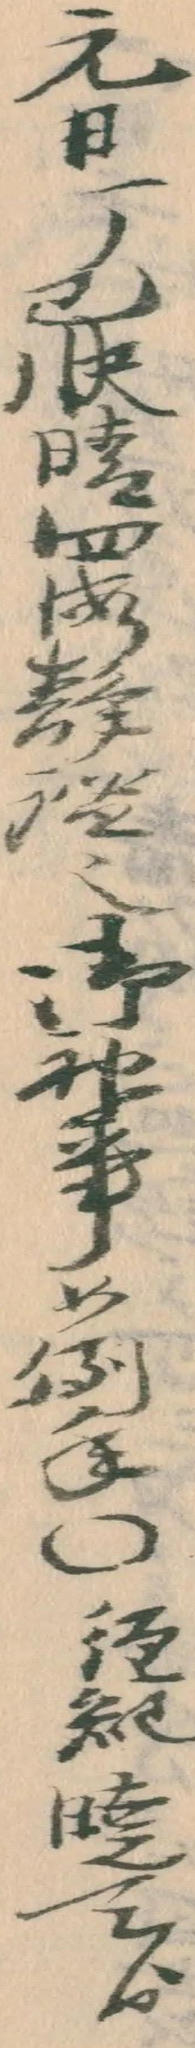元日丁巳快晴四海静謐也御神事如例年○経紀暁天ゟ
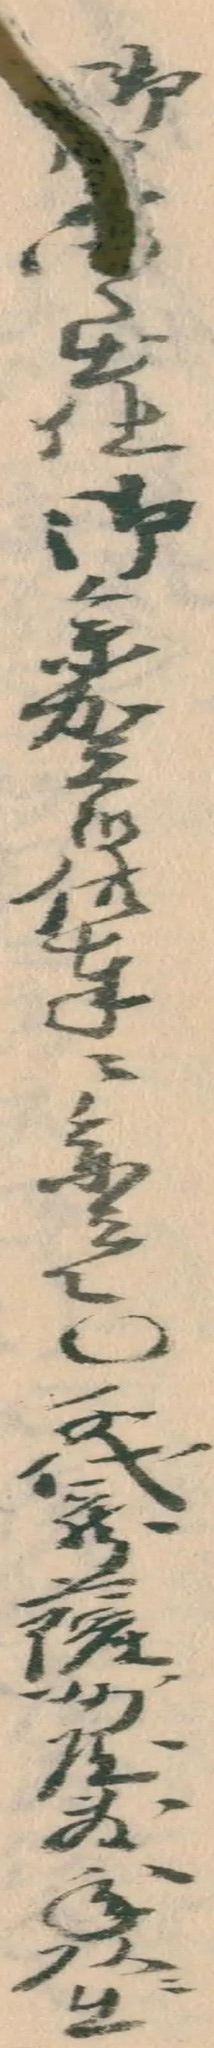御家門へ出仕御参賀御供奉ニ参云々○千代蔵薩州屋敷年頭ニ出
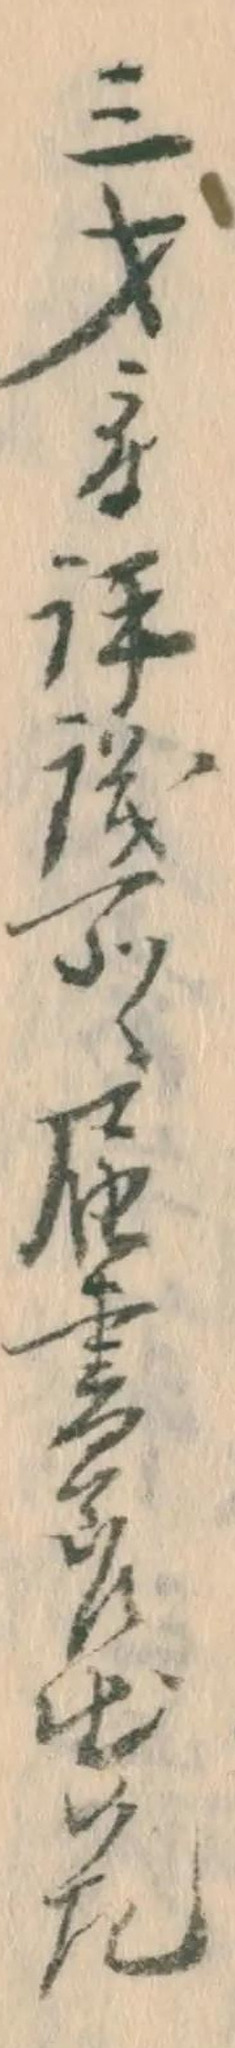三才ニ付評議所へ届書差出如左
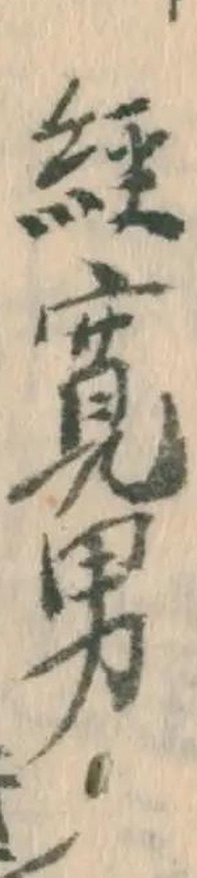経寛男
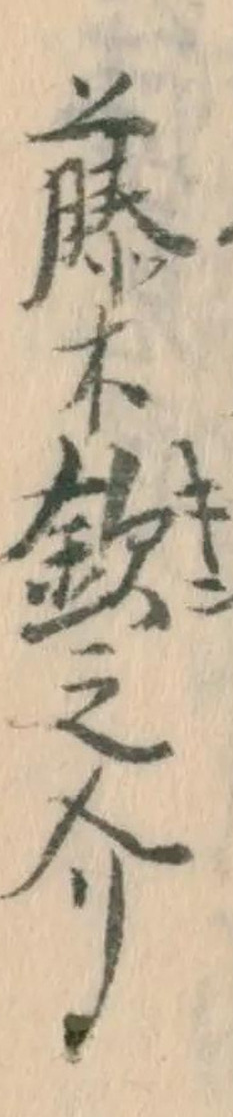藤木欽之介
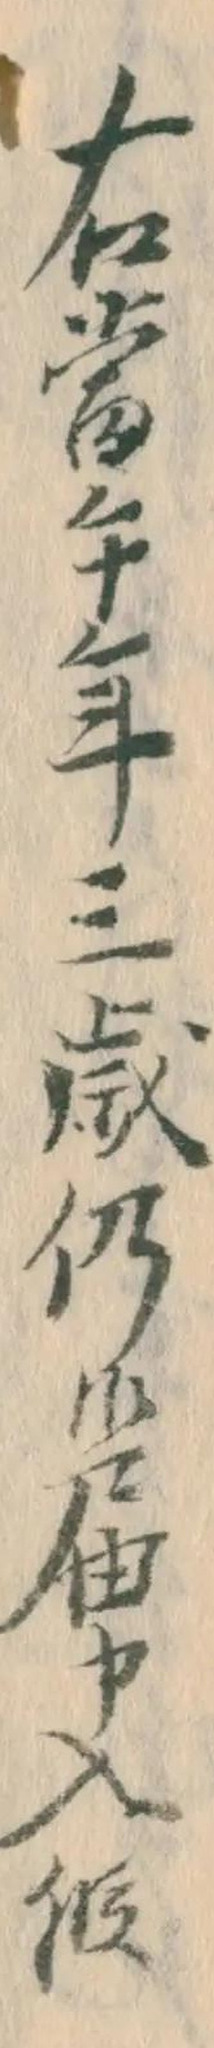右當午年三歳仍御届申入候
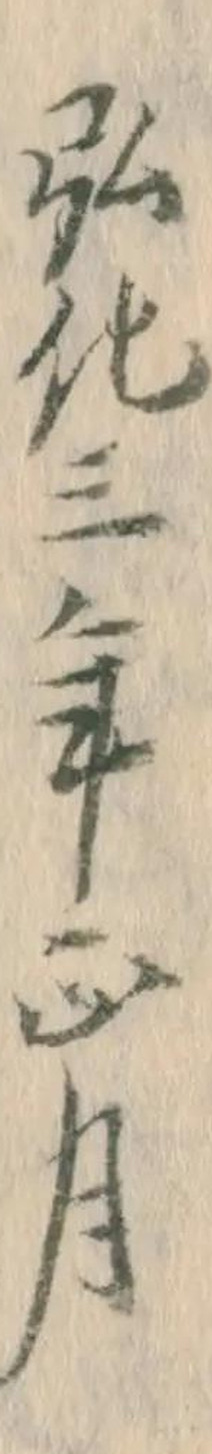弘化三年正月
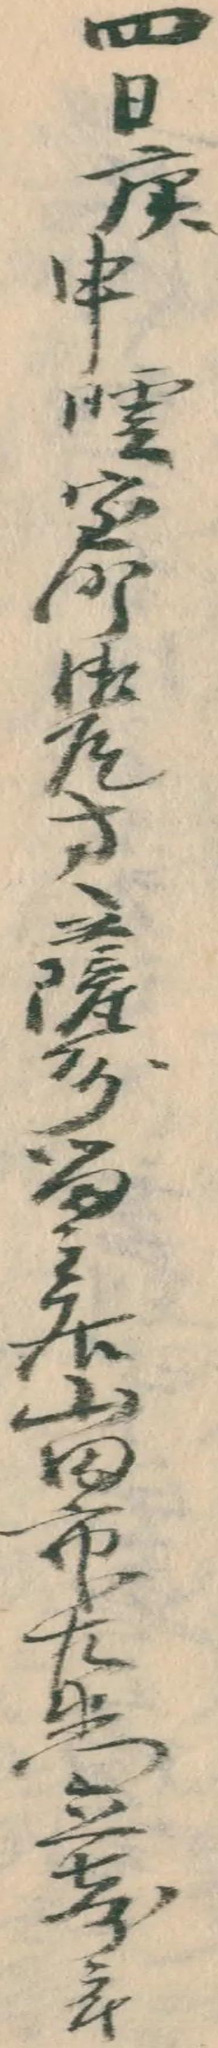四日庚申曇室町瀬尾方へ薩州留守居山田市左衛門立寄ニ付
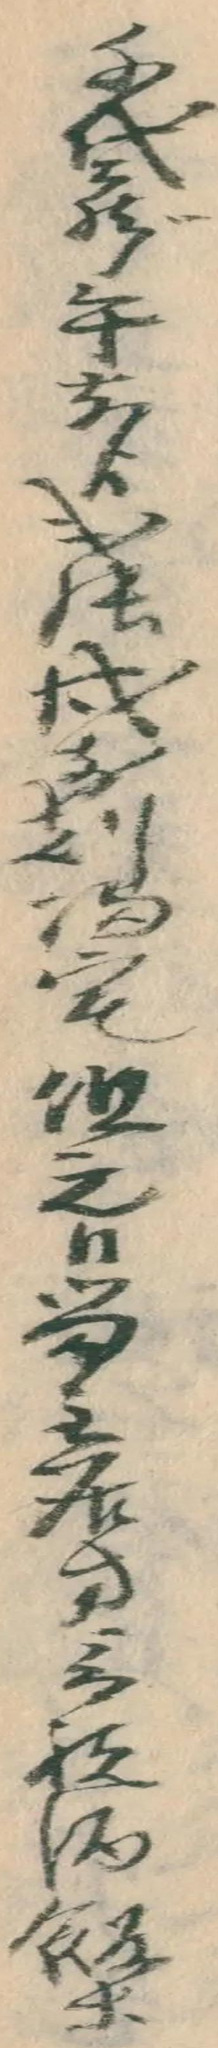千代蔵午前ゟ出張戌前刻帰宅但元日留主居方ニ而祝酒飯等

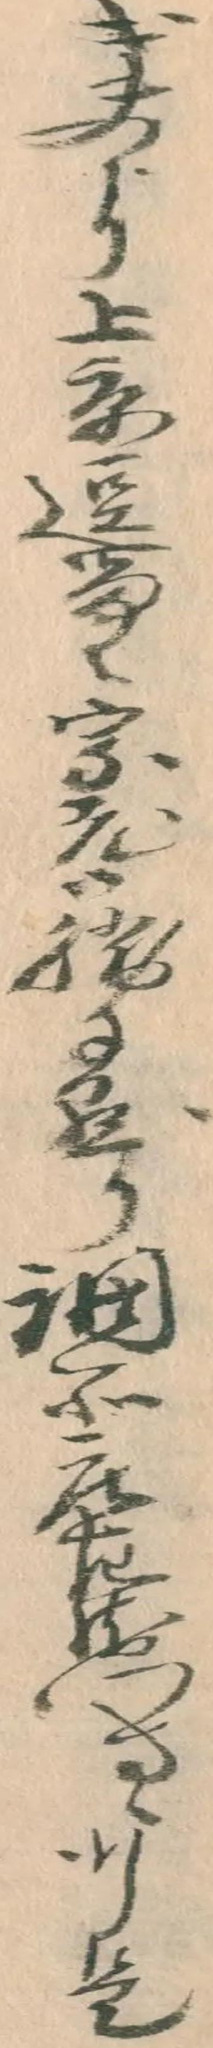出夫より上京逗留之家老御勝手懸り調所庄左衛門方へ行是
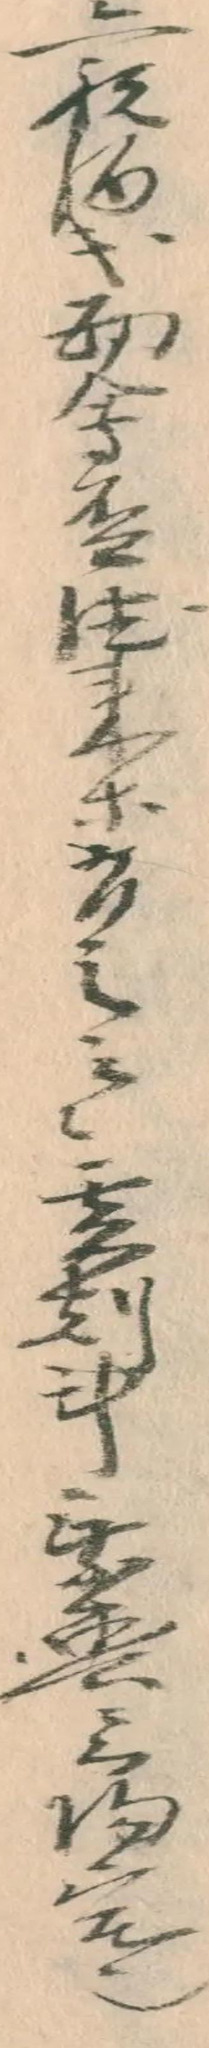ニ祝酒出面會盃往来等有之云々亥刻斗乗輿ニ而帰宅也
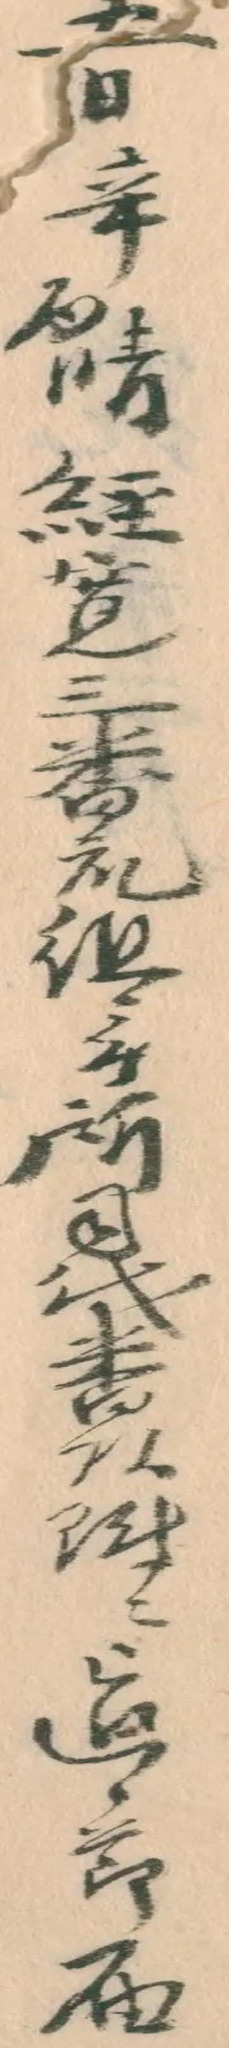五日辛酉晴経寛三番衆組ニ付所司代番頭附ニ被廻候節届
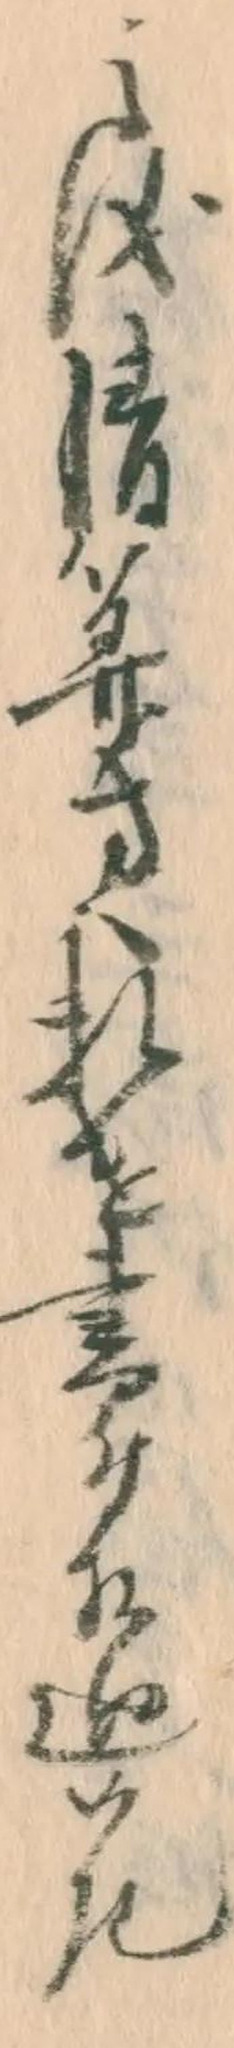之儀情算方へ札を書付相廻候様
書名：賀茂社記録. 第70冊
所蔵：国立国会図書館 National Diet Library, JAPAN
